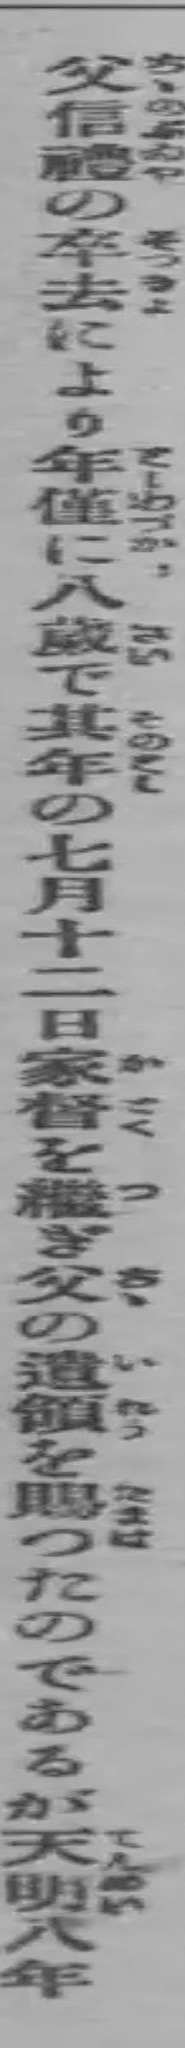父信礼の卒去により年僅に八歳で其年の七月十二日家督を継ぎ父の遺領を賜つたのであるが天明八年

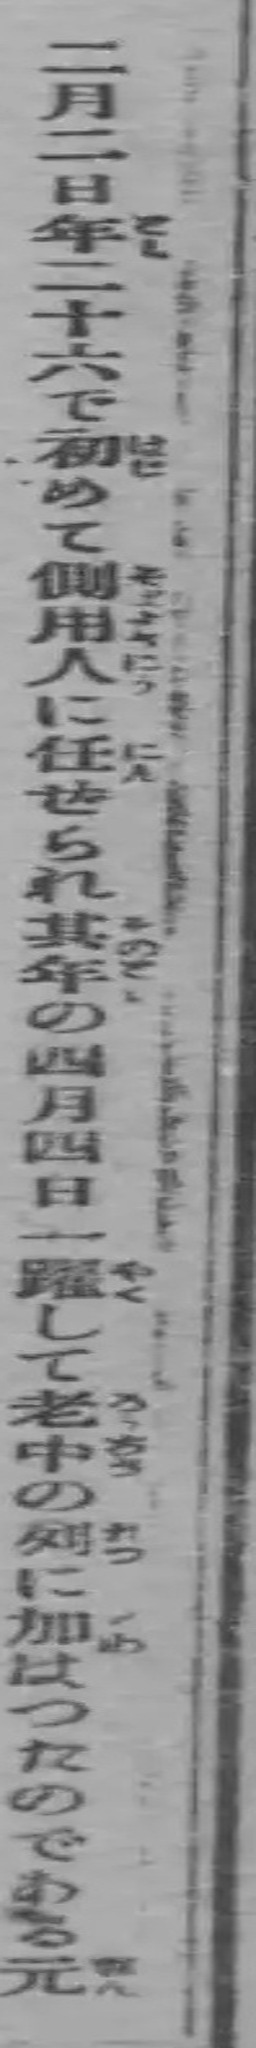二月二日年二十六で初めて側用人に任ぜられ其年の四月四日一躍して老中の列に加はつたのである元
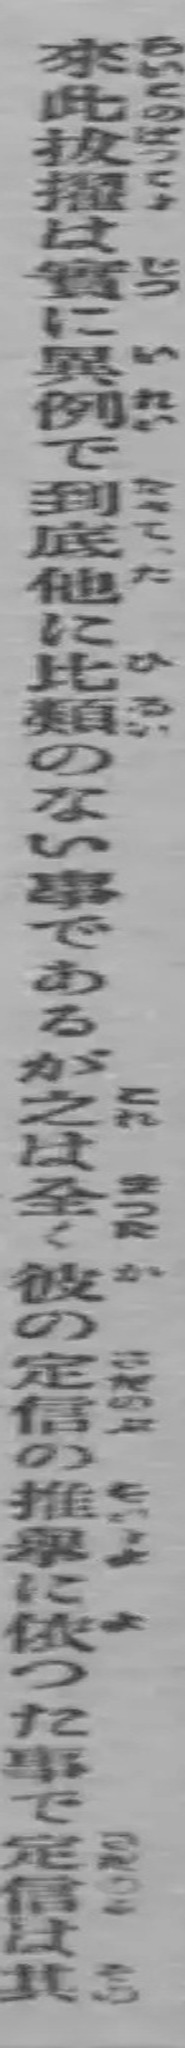来此抜擢は実に異例で到底他に比類のない事であるが之は全く彼の定信の推挙に依つた事で定信は其
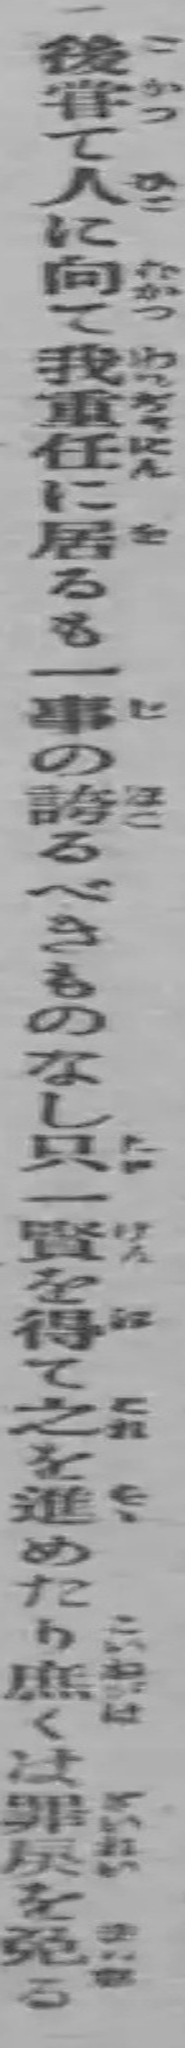後嘗て人に向て我重任に居るも一事の誇るべきものなし只一賢を得て之を進めたり庶くは罪戻を免る
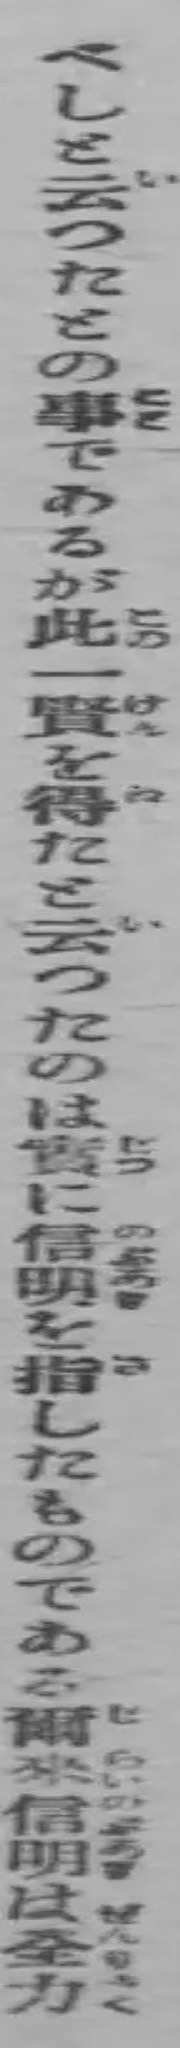べしと云つたとの事であるが此一賢を得たと云つたのは実に信明を指したものである爾来信明は全力
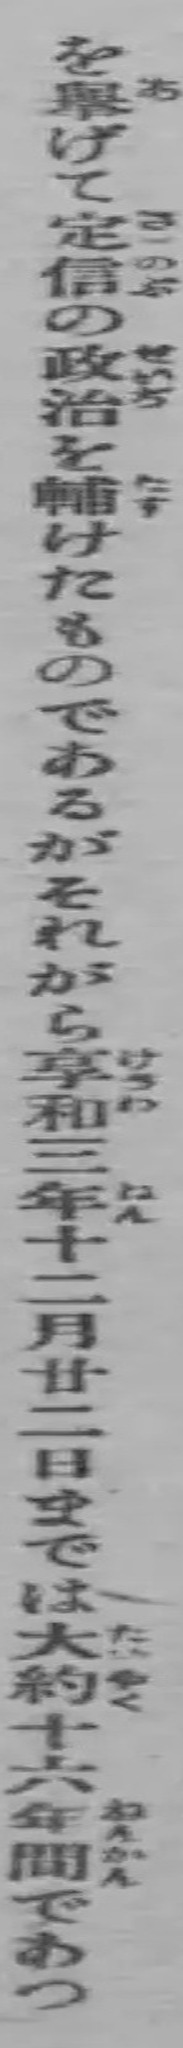を挙げて定信の政治を輔けたものであるがそれから享和三年十二月廿二日までは大約十六年間であつ
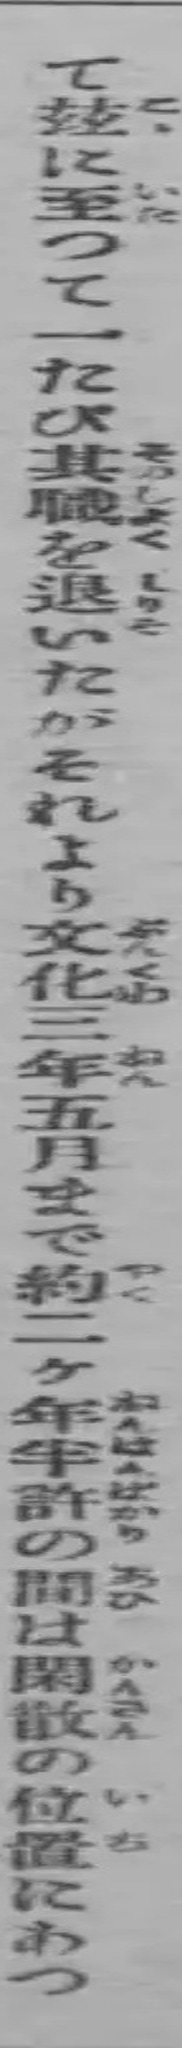て茲に至つて一たび其職を退いたがそれより文化三年五月まで約二ケ年半許の間は閑散の位置にあつ
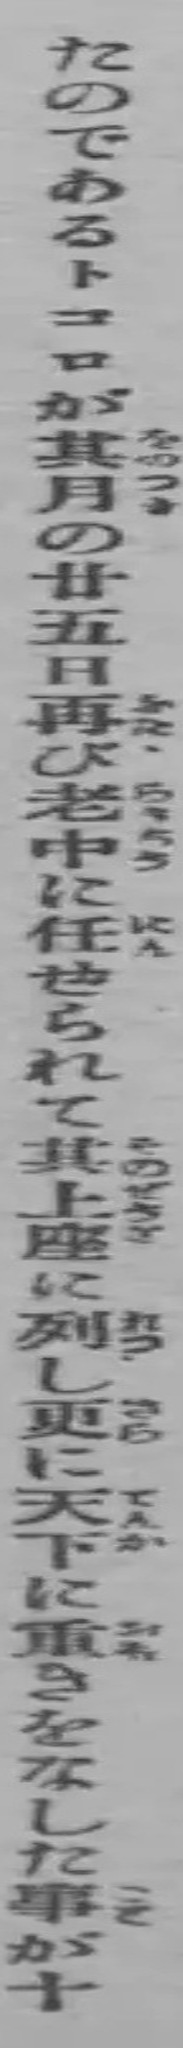たのであるトコロが其月の廿五日再び老中に任ぜられて其上座に列し更に天下に重きをなした事が十
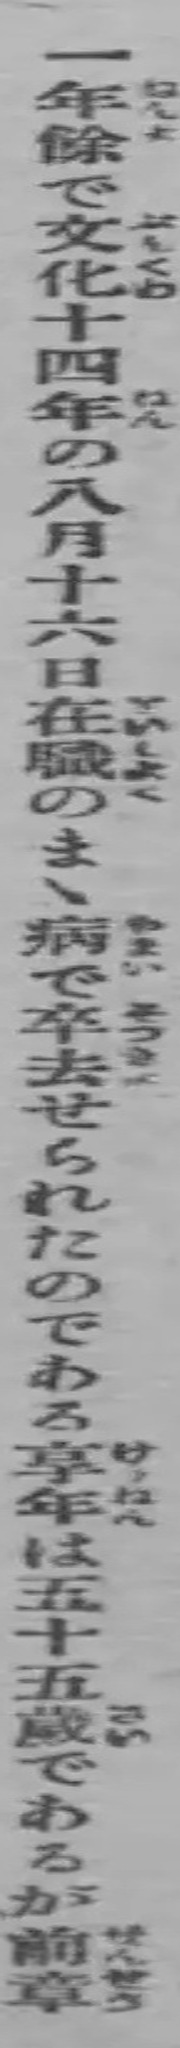一年余で文化十四年の八月十六日在職のまゝ病で卒去せられたのである享年は五十五歳であるが前章
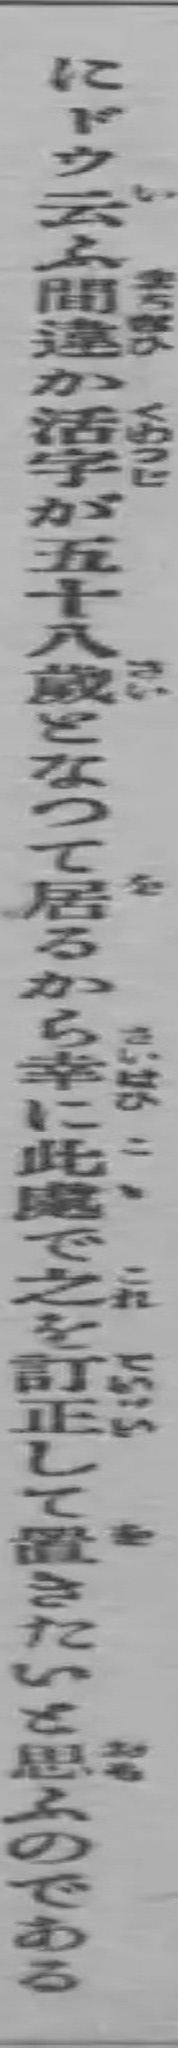にドウ云ふ間違か活字が五十八歳となつて居るから幸に此処で之を訂正して置きたいと思ふのである
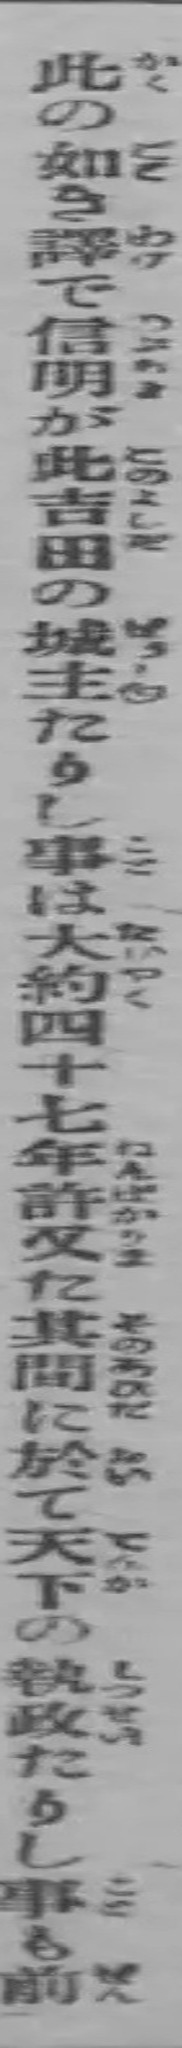此の如き訳で信明が此吉田の城主たりし事は大約四十七年許又た其間に於て天下の執政たりし事も前
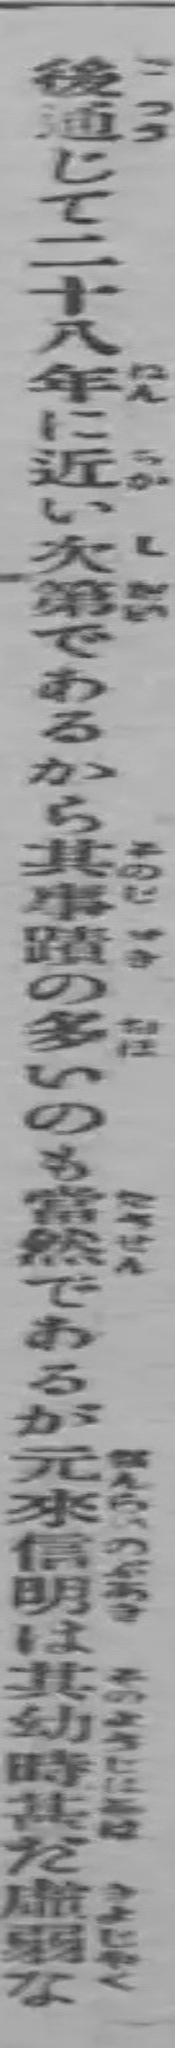信明の体質後通じて二十八年に近い次第であるから其事蹟の多いのも当然であるが元来信明は其幼児甚だ虚弱な
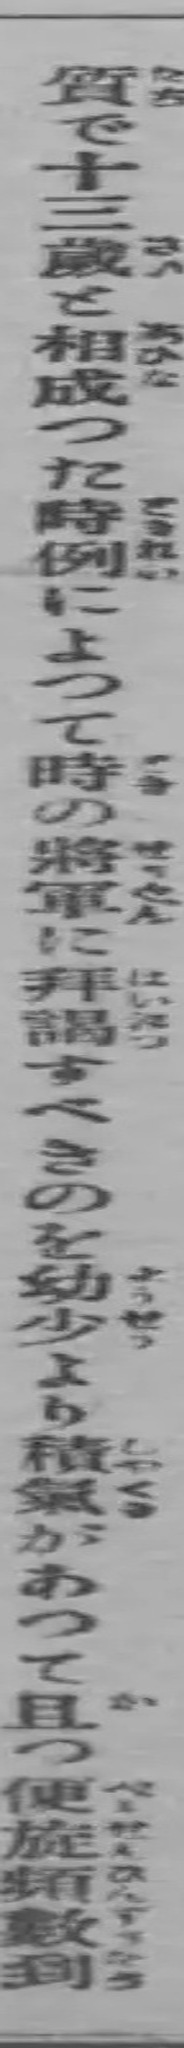質で十三歳と相成つた時例によつて時の将軍に拝謁すべきものを幼少より積気があつて且つ便旋頻数到
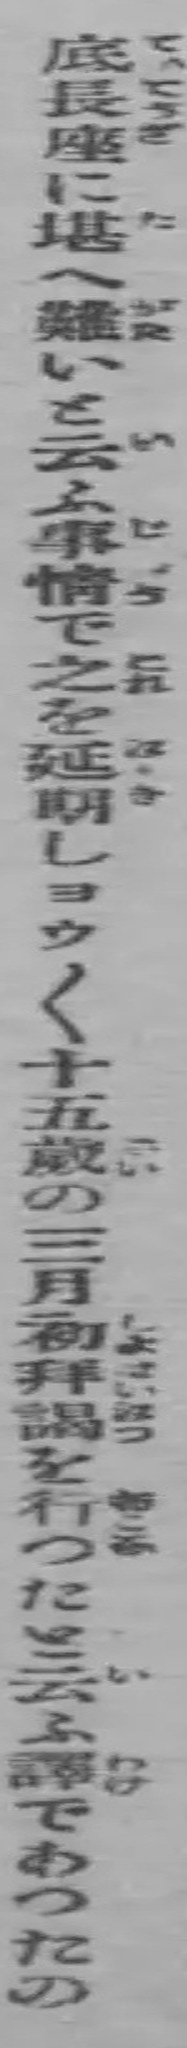底長座に堪へ難いと云ふ事情で之を延期しヨウ〳〵十五歳の三月初拝謁を行つたと云ふ訳であつたの
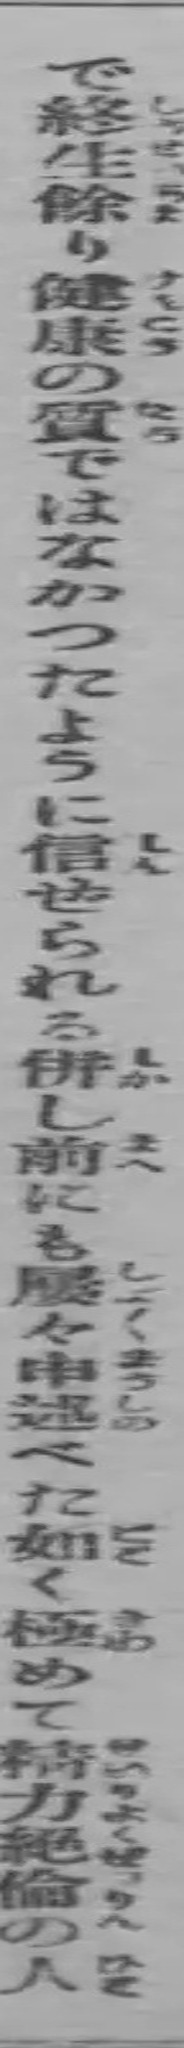で終生余り健康の質ではなかつたように信ぜられる併し前にも屡々申述べた如く極めて精力絶倫の人
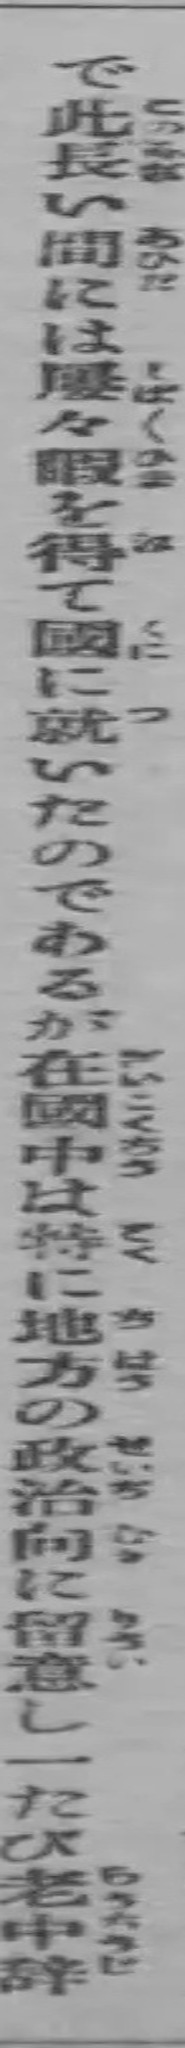で此長い間には屡々暇を得て国に就いたのであるが在国中は特に地方の政治向に留意し一たび老中辞
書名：豊橋市史談
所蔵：国立国会図書館 National Diet Library, JAPAN
